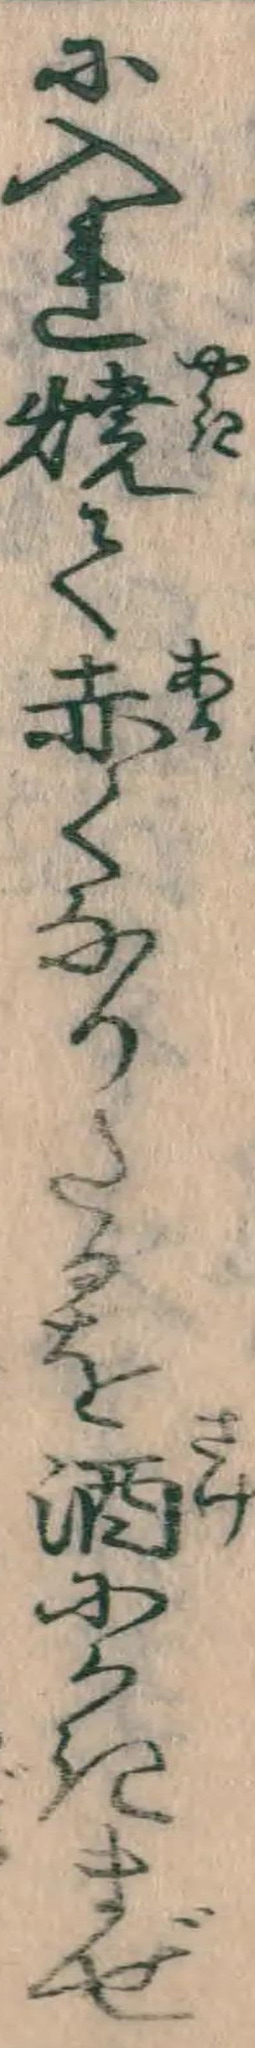に入れ焼て赤くなりたるを酒にかきまぜ
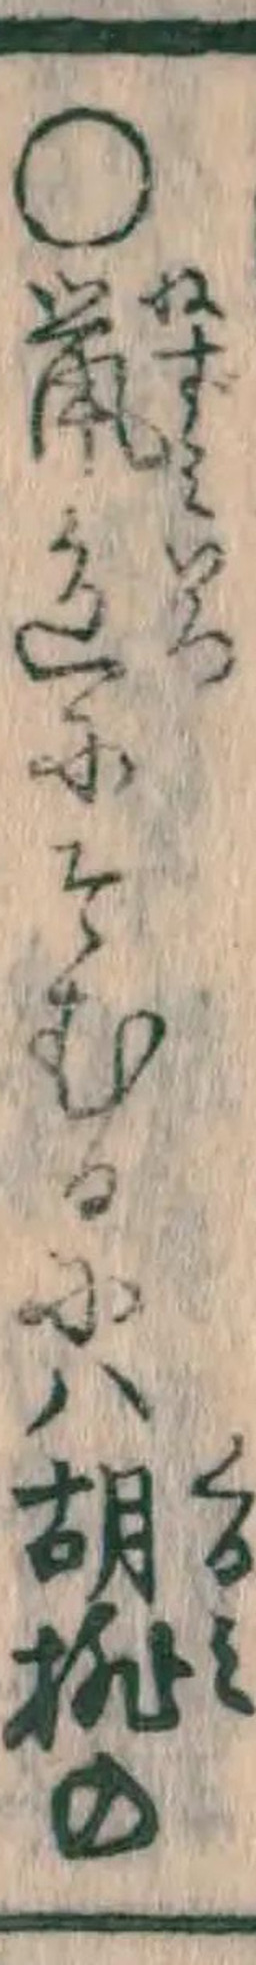○鼠色にそむるには胡桃の
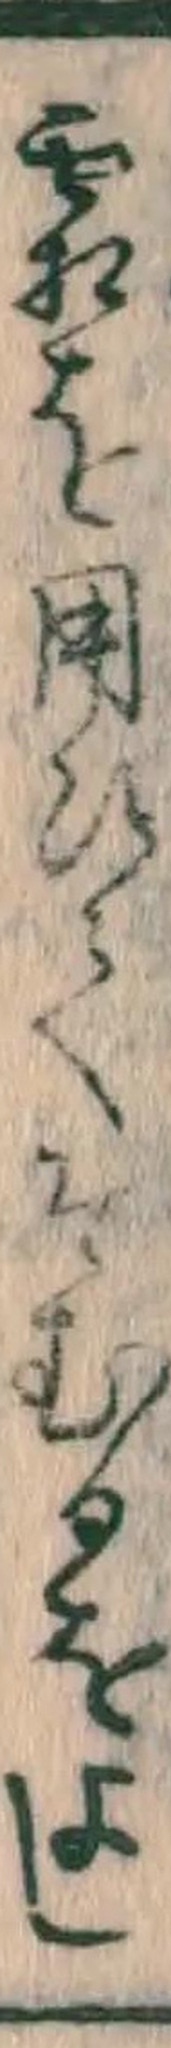霜を用ひてそむるをよし
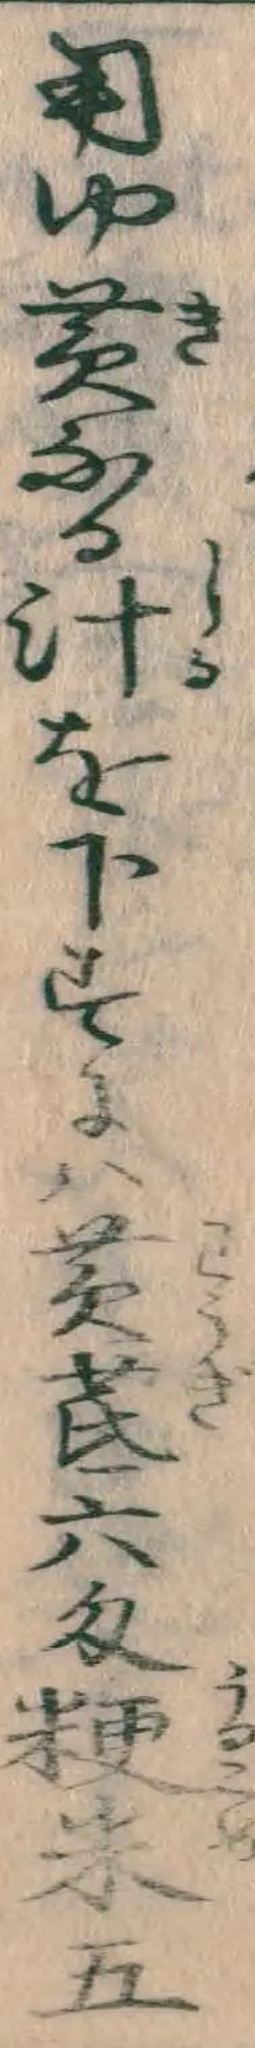用ゆ黄なる汁を下すには黄芪六匁粳米五
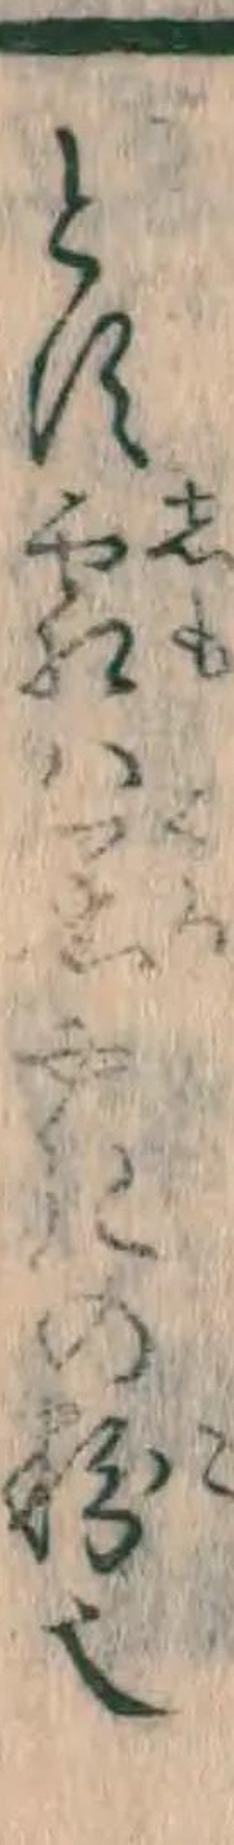とす霜は黒やきの粉也
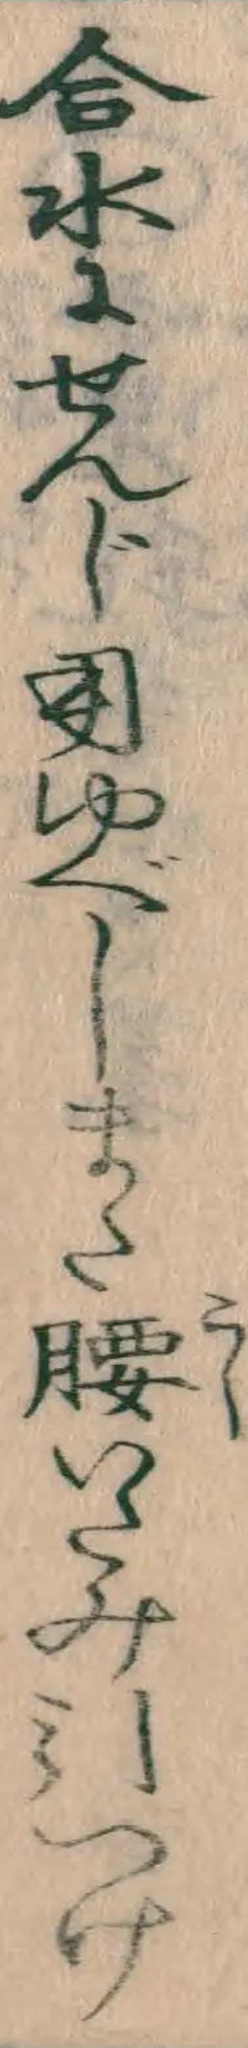合水にせんじ用ゆべしまた腰いたみ引つけ
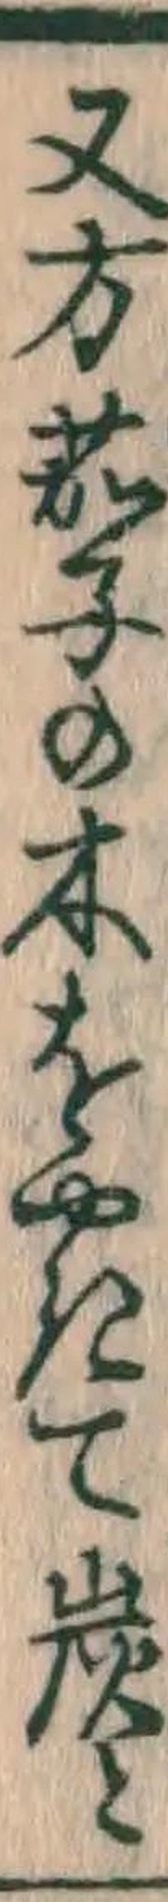又方茄子の木をやきて炭と
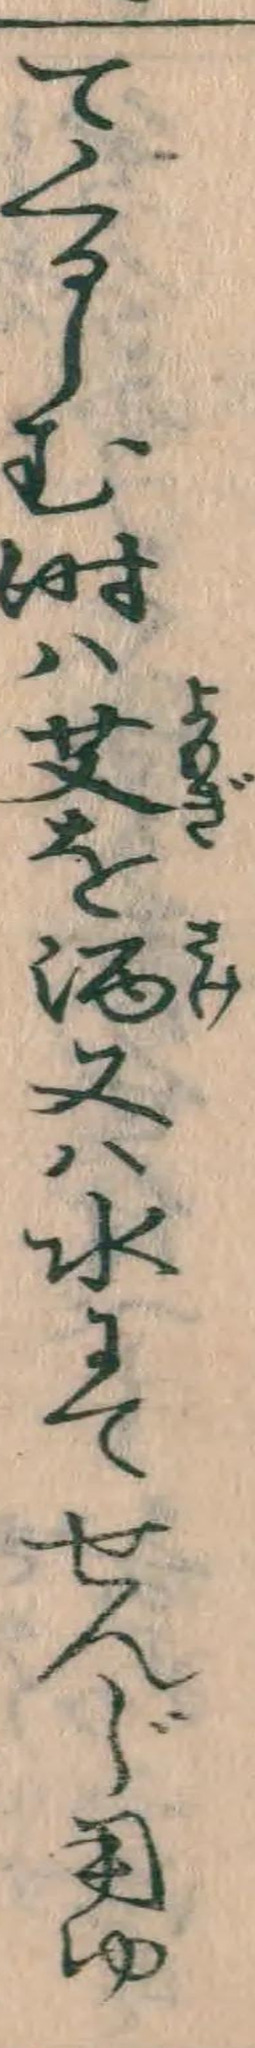てくるしむ時は艾を酒又は水にてせんじ用ゆ
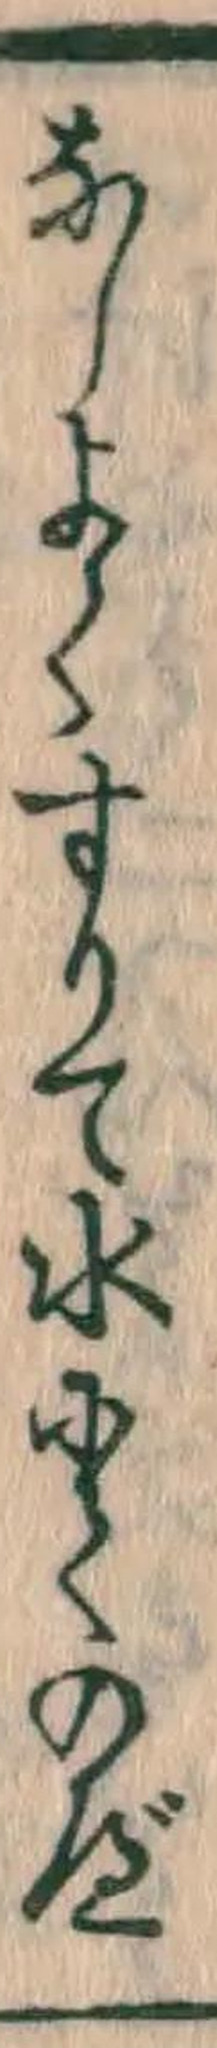なしよくすりて水にてのべ
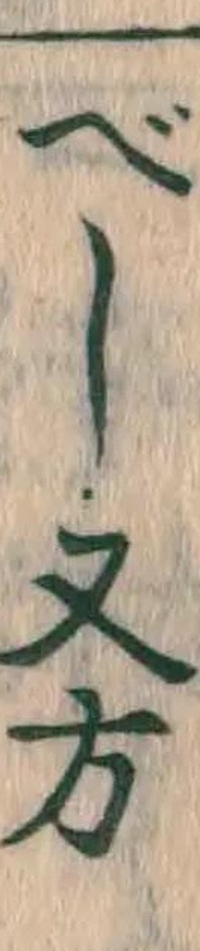べし又方
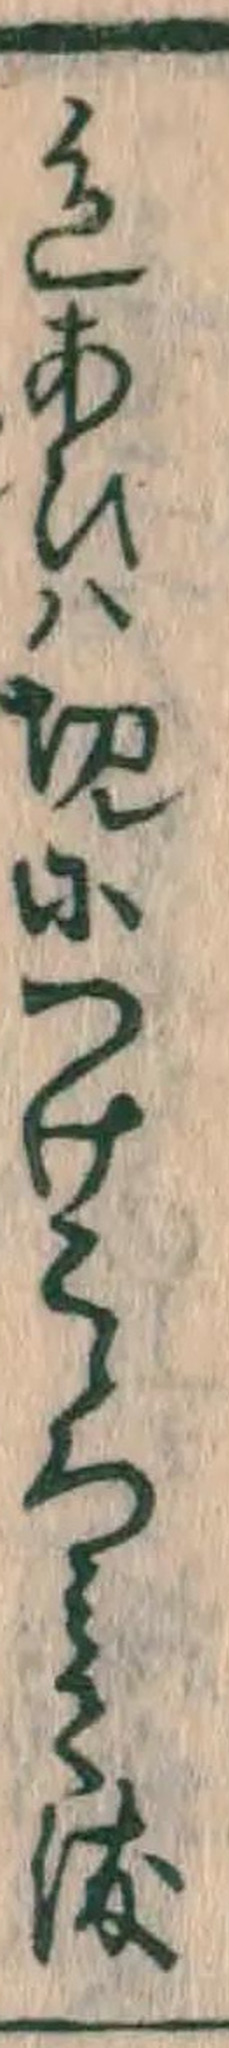色あひは切ゝろみて染
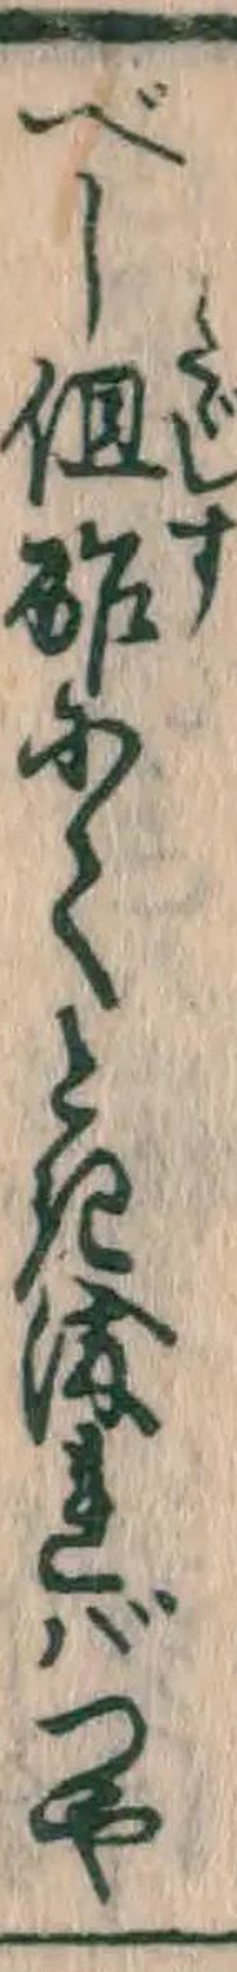べし但酢にてとき染ればつや
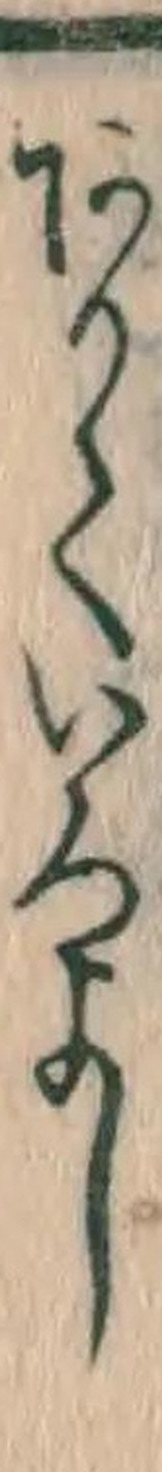ありていろよし
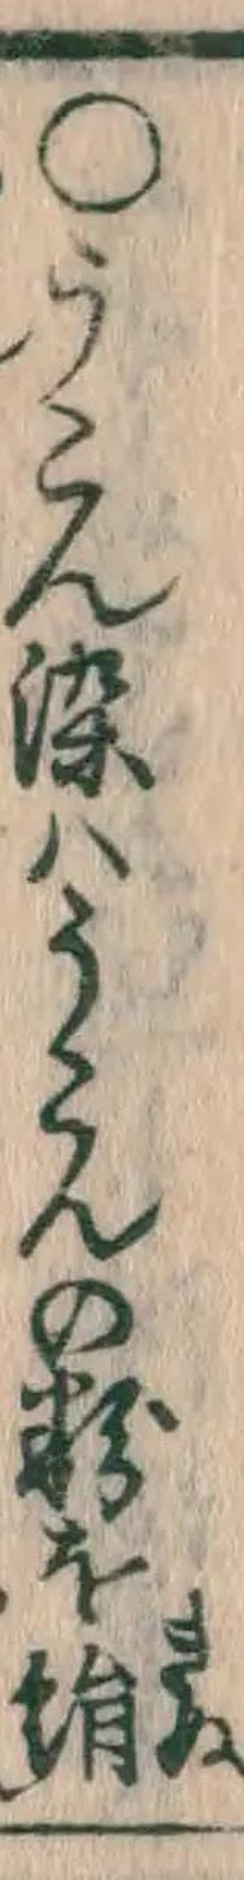○うこん染はうこんの粉を絹
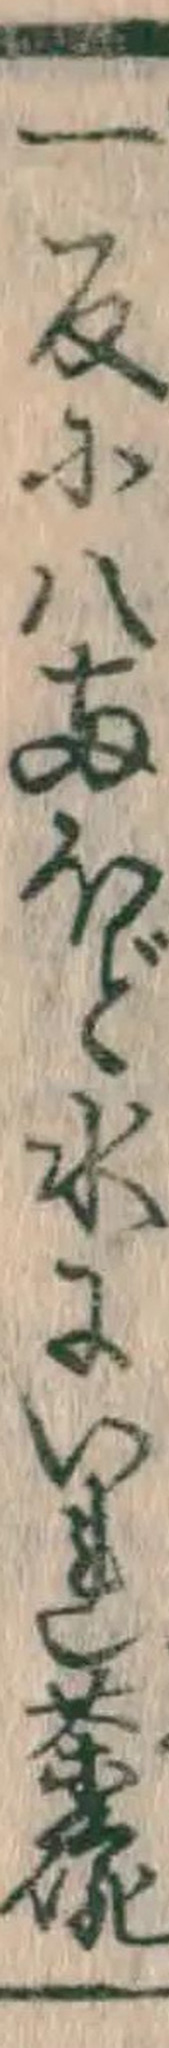一反に八両ほど水にいれ茶碗
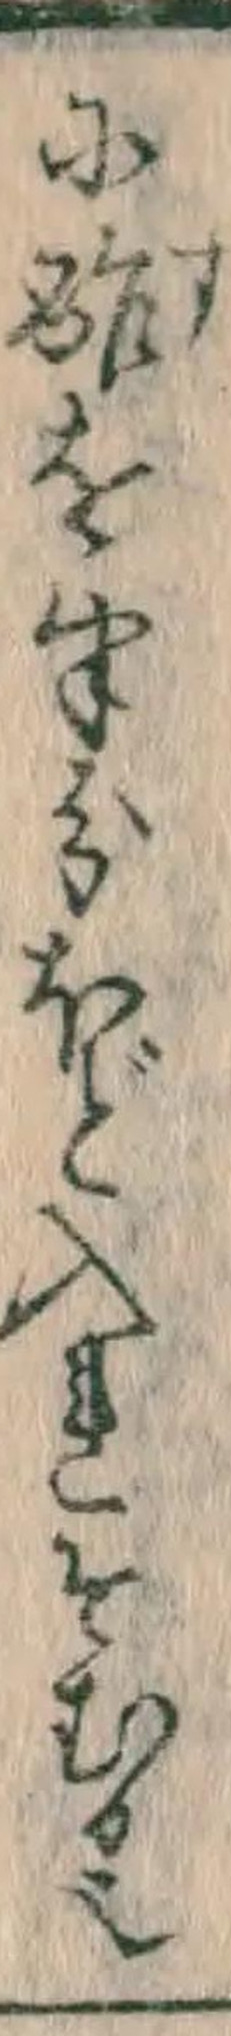に酢を半分ほど入れそむる也
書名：広益秘事大全 3巻. [3]
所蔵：国立国会図書館 National Diet Library, JAPAN
